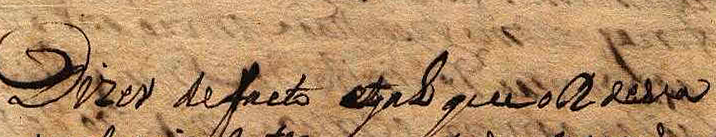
Dizer de facto e tjaL que o R devia
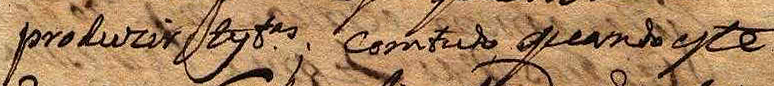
produzir test.as; comtudo quando este
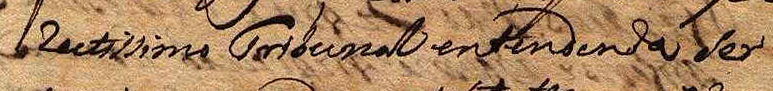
Rectissimo Tribunal entendendo ser
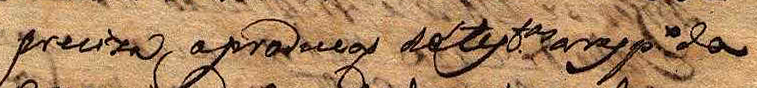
preciza a produçaꝭ de test.as a resp.o da
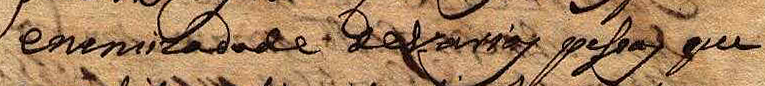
enemizadade de varias pesoas que
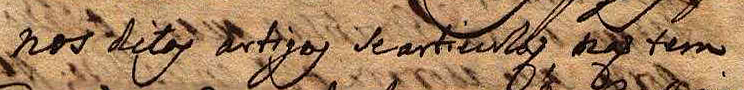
nos ditos artigos se articulaꝭ, naõ tem
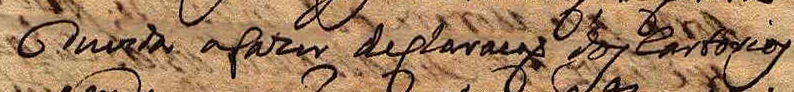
duvida o fazer deClaraçaõ dos Cartorios
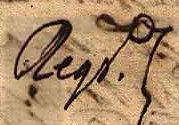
Reqr.o
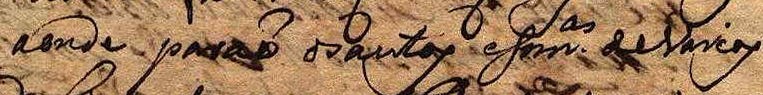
aonde paraõ os autos e form.as de Varios
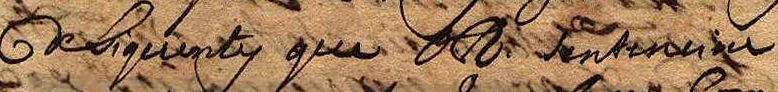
deliquentes que O R. sentenciou
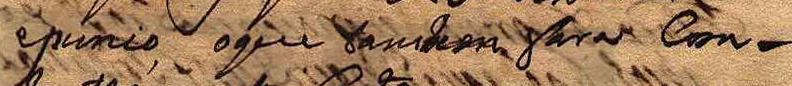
e punio, o que tambem fara Com
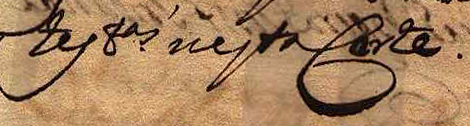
testas. nesta Corte.
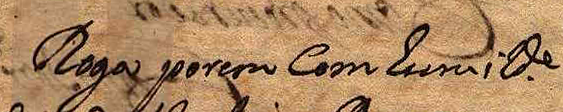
Roga porem Com humild.e
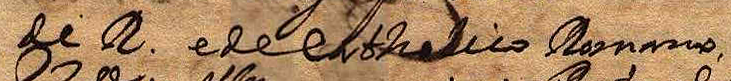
de R. e de catholico Romano,
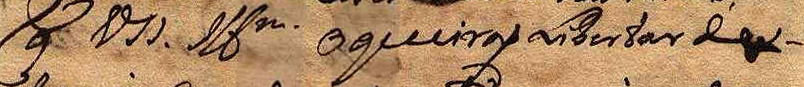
q̄ Vss. Ill.m o queiraꝭ Libertar des
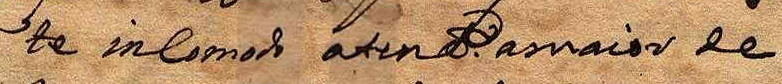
te incomodo atend.o a maior de
